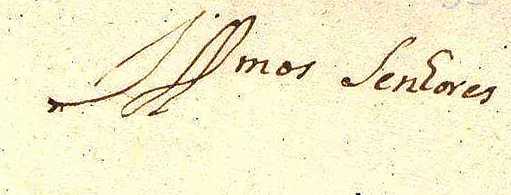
Illmos Senhores
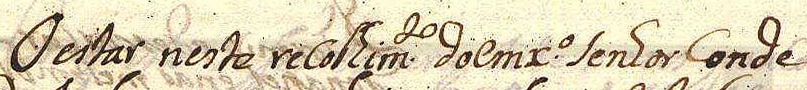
O estar neste recolhim.to do emx.o senhor Conde
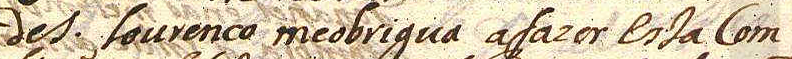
de S. Lourenço me obrigua a fazer esta Com
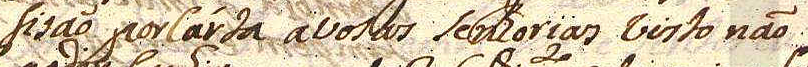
fisaõ por Carta a vosas senhorias visto naõ
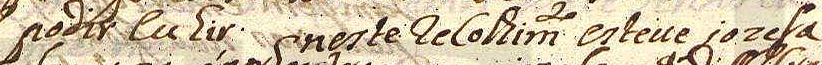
podir eu hir; neste Recolhimto esteue jozefa
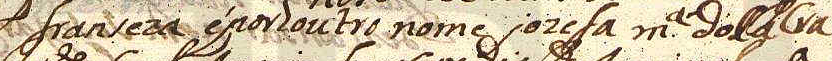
franseza e por houtro nome jozefa m.a do Sacra
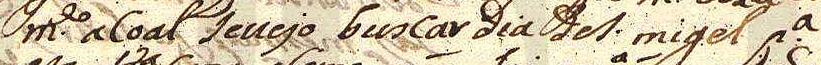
m.to a Coal se uejo buscar dia de s. migel p.a
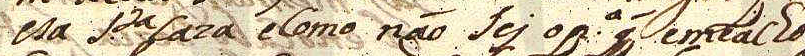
esa s.ta Caza e Como naõ sej o p.a q̄ e me acho
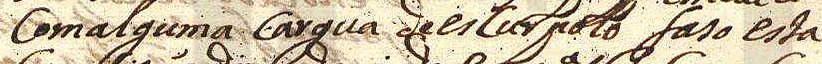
Com alguma Cargua de esCurpolo faso esta
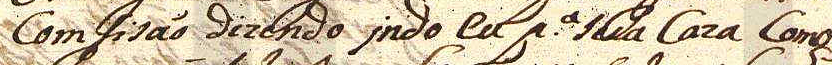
Comfisaõ dizendo jndo eu p.a sua Caza Como
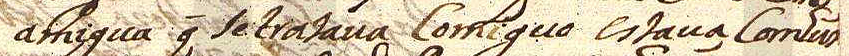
amigua q̄ se trataua Comiguo estaua Com hūs
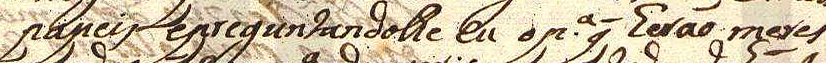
papeis e preguntandolhe eu o p.a q̄ heraõ me res
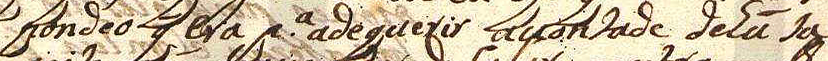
pondeo q̄ era p.a adequerir a uontade de hū su
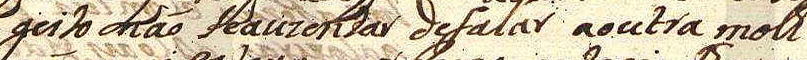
geito naõ se auzentar de falar a outra molh
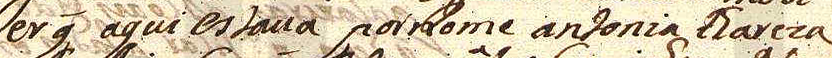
er q̄ aqui estaua por nome antonia thareza
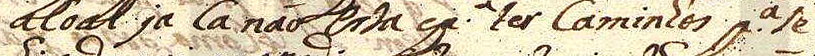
a Coal ja Ca naõ Esta e p.a ter Caminhos p.a se
